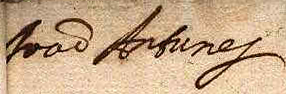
Ioaõ Antunes
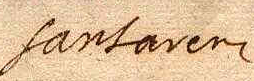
santarem
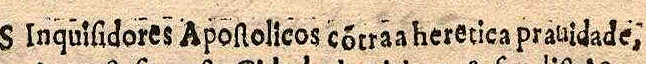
S Inquisidores Apostolicos cōtra a heretica prauidade,
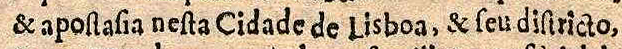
& apostasia nesta Cidade de Lisboa, & seu districto,
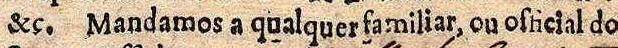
&c. Mandamos a qualquer familiar, ou official do
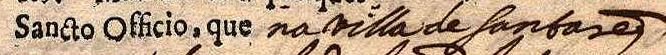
Sancto Officio, que na villa de santarē,
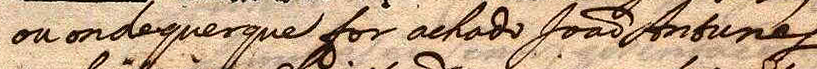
ou onde quer que for achado Joaõ Antunez
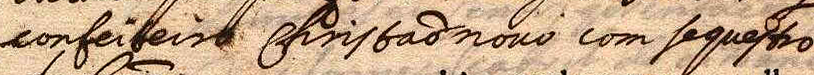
confeiteiro Christaõ nouo com sequestro
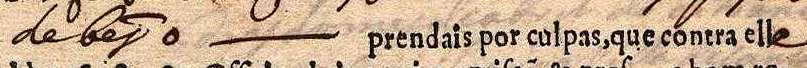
de bēs - prendais por culpas, que contra elle
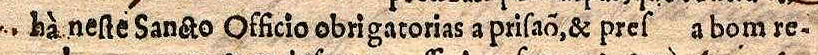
hà neste Sancto Officio obrigatorias a prisaõ, & pres a bom re
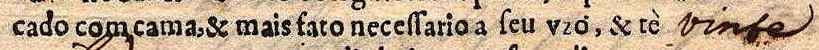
cado com cama, & mais fato necessario a seu vzo, & tè vinte
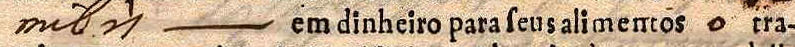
mil rs̄ - em dinheiro para seus alimentos o tra
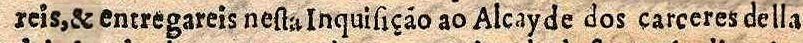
reis, & entregareis nesta Inquisição ao Alcayde dos carceres della
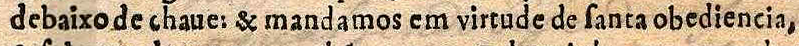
debaixo de chaue: & mandamos em virtude de santa obediencia,
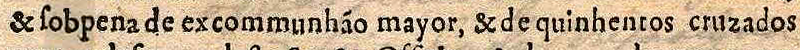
& sob pena de excommunhão mayor, & de quinhentos cruzados
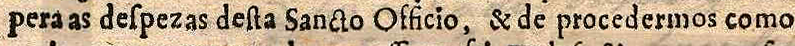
pera as despezas desta Sancto Officio, & de procedermos como
